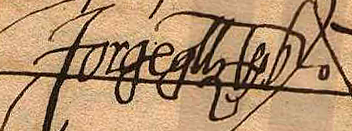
Jorge ḡllz Rybro
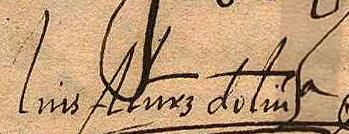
Luis Alūrz doliura
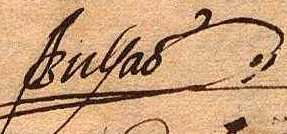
Bulhaõ
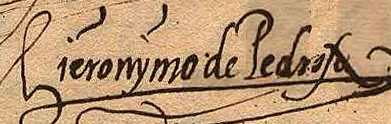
hieronymo de Pedrosa
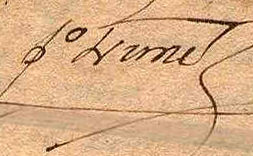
po Nunez
